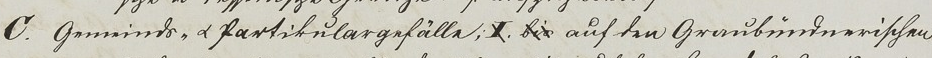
C. Gemeinds- & Partikulargefälle; I. bis auf den Graubündnerischen
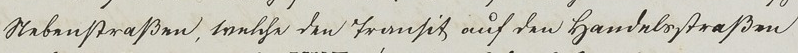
Nebenstraßen, welche den Transit auf den Handelsstraßen
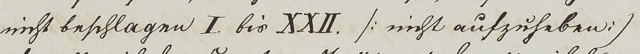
nicht beschlagen I. bis XXII. (nicht aufzuheben)
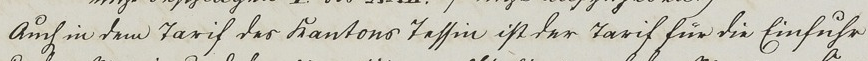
Auch in dem Tarif des Kantons Tessin ist der Tarif für die Einfuhr
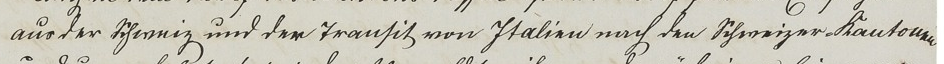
aus der Schweiz und der Transit von Italien nach den Schweizer-Kantonen
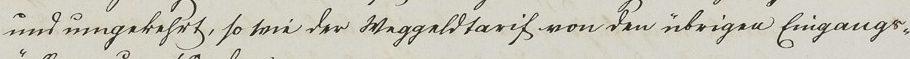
und umgekehrt, so wie der Weggeldtarif von den übrigen Eingangs-
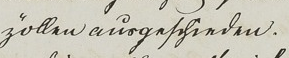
zöllen ausgeschieden.
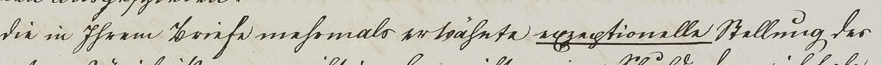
Die in Ihrem Briefe mehrmals erwähnte exzeptionelle Stellung des
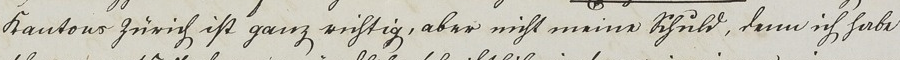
Kantons Zürich ist ganz richtig, aber nicht meine Schuld, denn ich habe
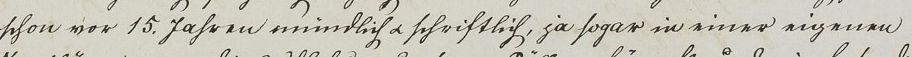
schon vor 15. Jahren mündlich & schriftlich, ja sogar in einer eigenen
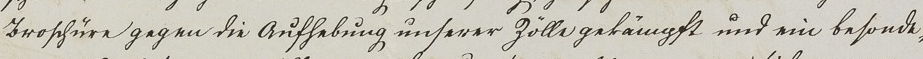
Broschüre gegen die Aufhebung unserer Zölle gekämpft und ein besonde-
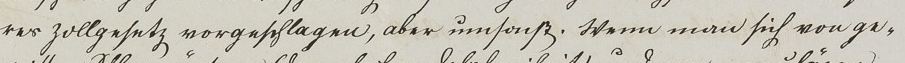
res Zollgesetz vorgeschlagen, aber umsonst. Wenn man sich von ge-
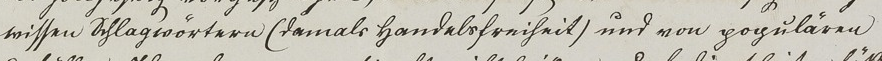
wissen Schlagwörtern (damals Handelsfreiheit) und von populären
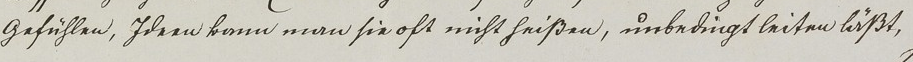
Gefühlen, Ideen kann man sie oft nicht heißen, unbedingt leiten läßt,
